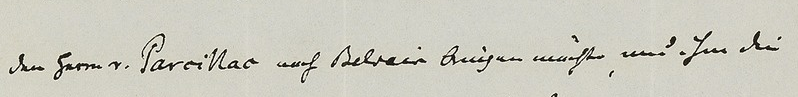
den Herrn v. Parcillac nach Belvoir bringen möchte, um ihm die
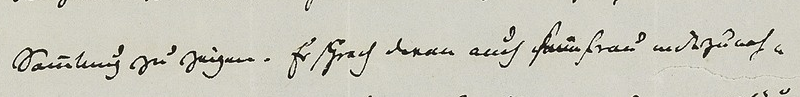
Sammlung zu zeigen. Er sprach davon auch seine Frau mitzuneh-
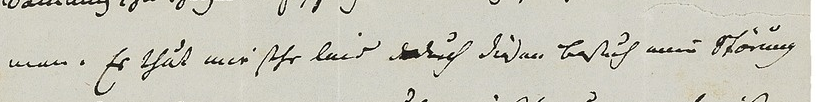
men. Es thut mir sehr leid dadurch diesen Besuch eine Störung
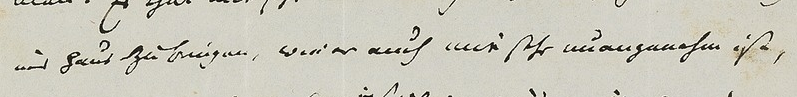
ins Haus zu bringen, wie es auch mir sehr unangenehm ist,
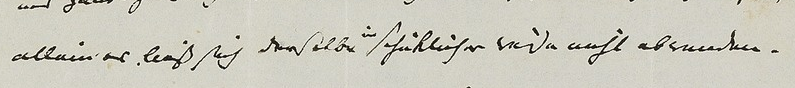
allein es ließ sich derselbe in schicklicher Weise nicht abwenden.
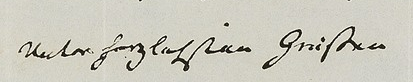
Unter herzlichsten Grüßen
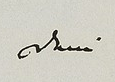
Dein
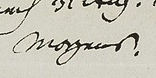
Morgens.
